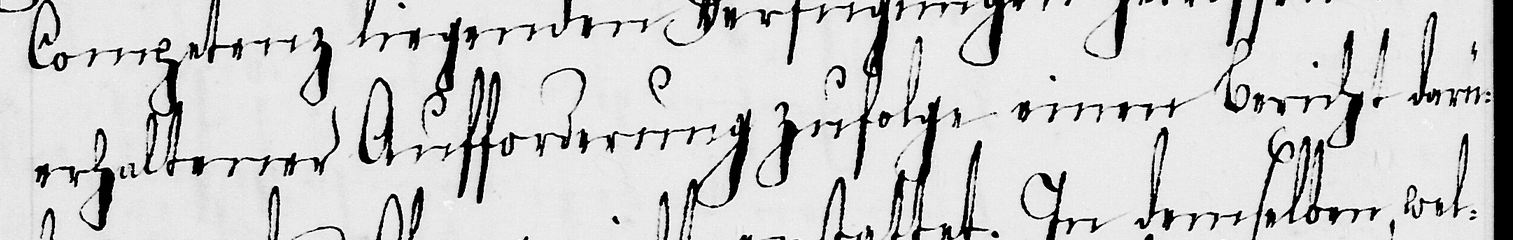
erhaltener Aufforderung zufolge einen Bericht darü¬
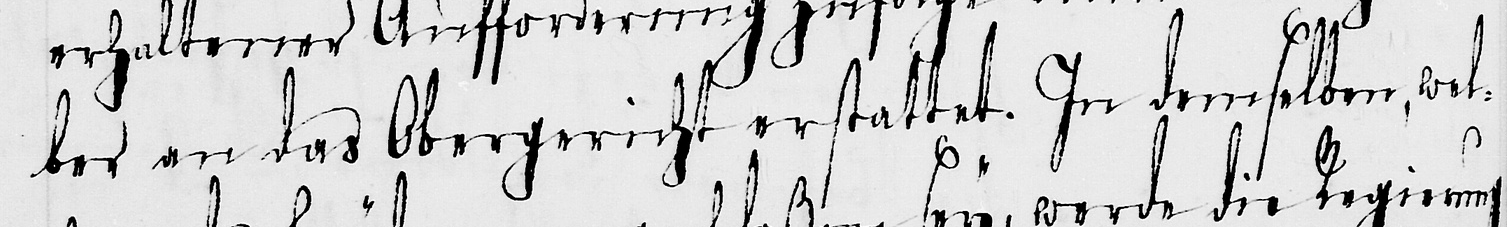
ber an das Obergericht erstattet. In demselben, we¬
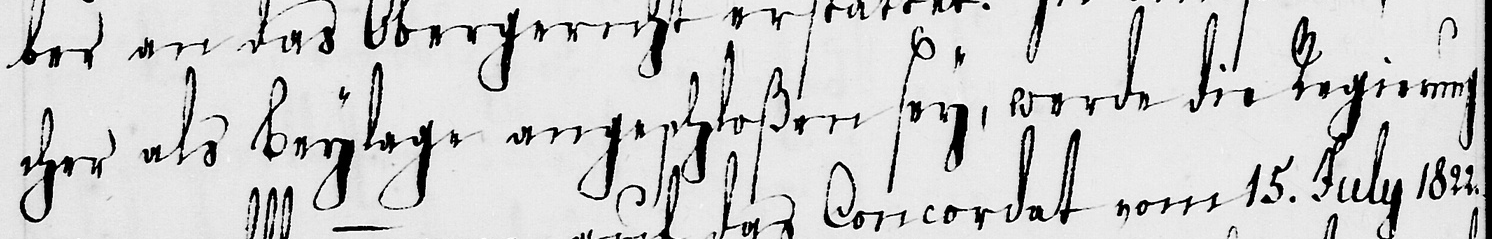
cher als Beylage angeschloßen sey, werde die Regieru¬
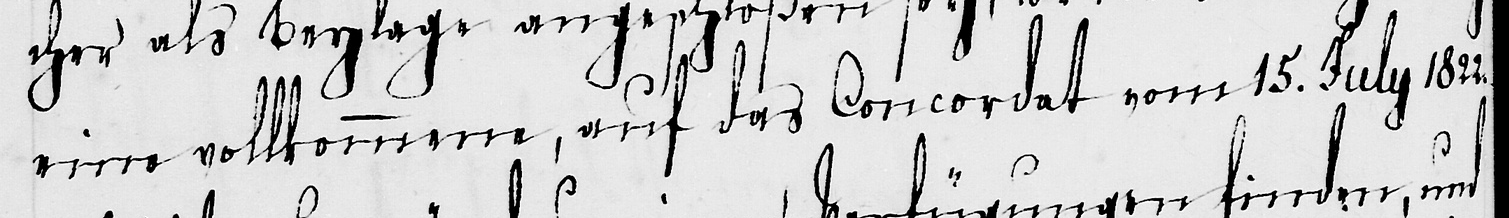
eine vollkommene, auf das Concordat vom 15. July 1822.
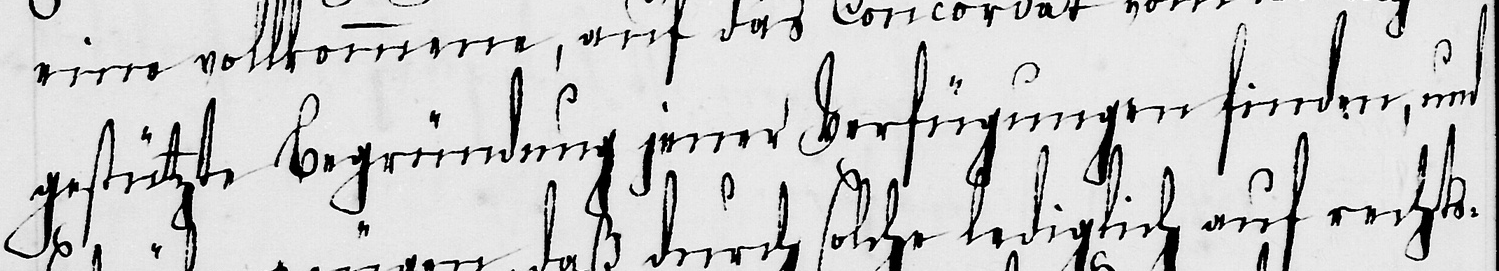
gestützte Begründung jener Verfügungen finden, und
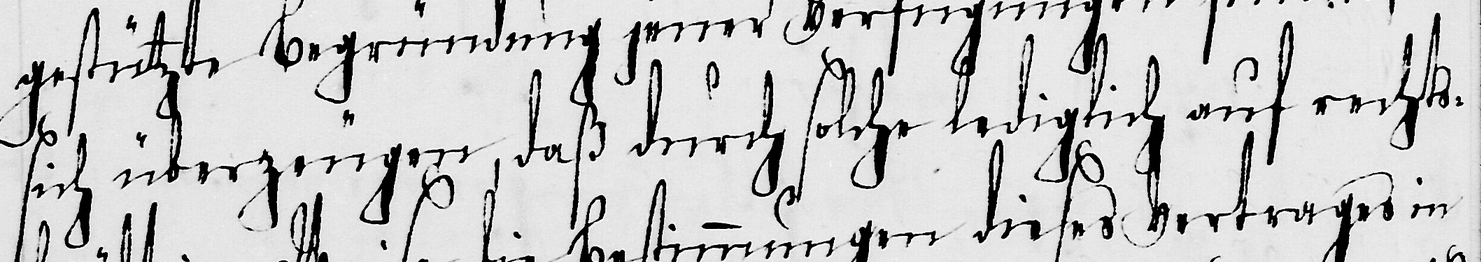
sich überzeugen, daß durch solche lediglich auf rechts¬
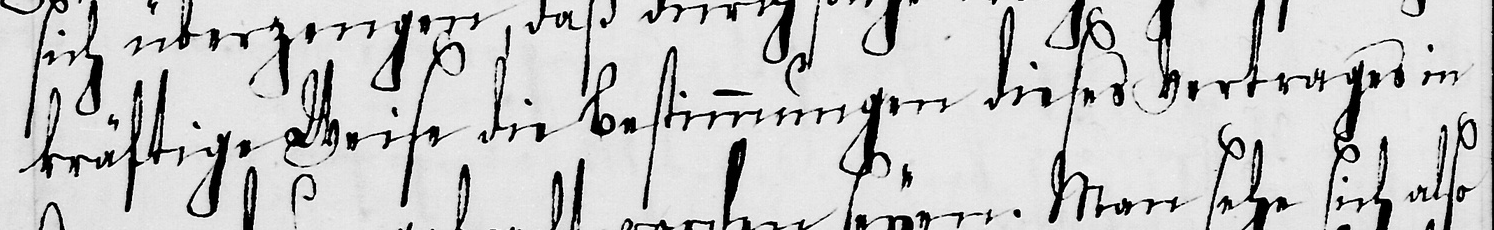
kräftige Weise die Bestimmungen dieses Vertrages in
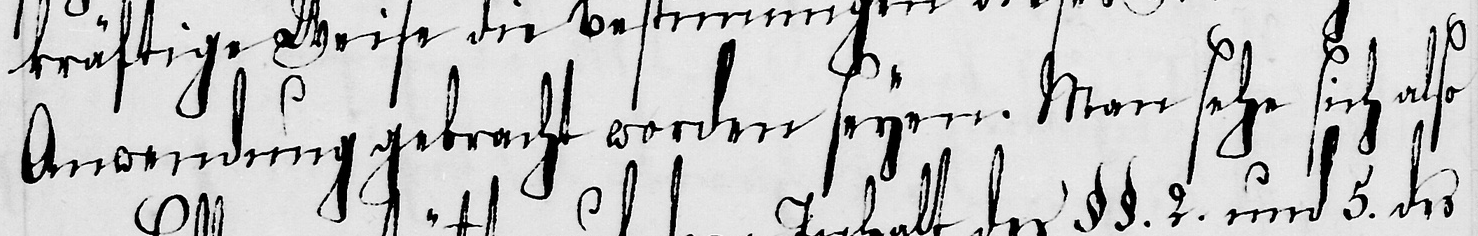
Anwendung gebracht worden seyen. Man sehe sich also
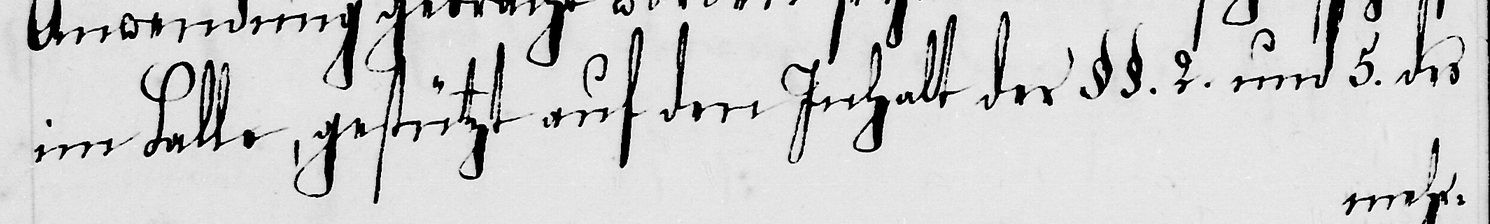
im Falle, gestützt auf den Inhalt der §§. 2. und 5. des
